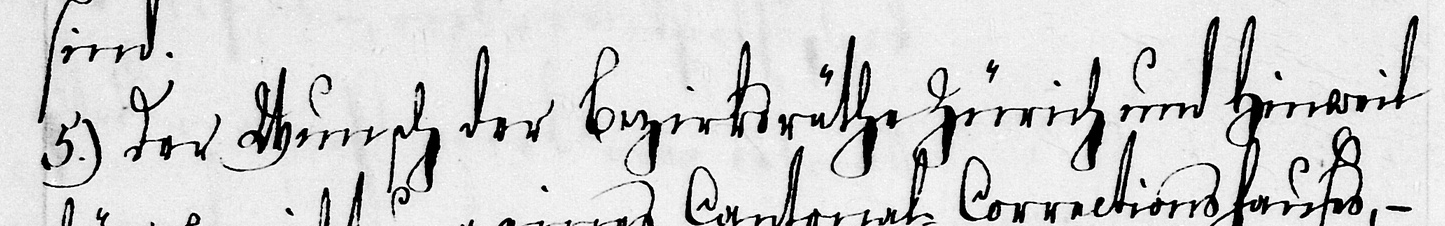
5.) Der Wunsch der Bezirksräthe Zürich und Hinweil
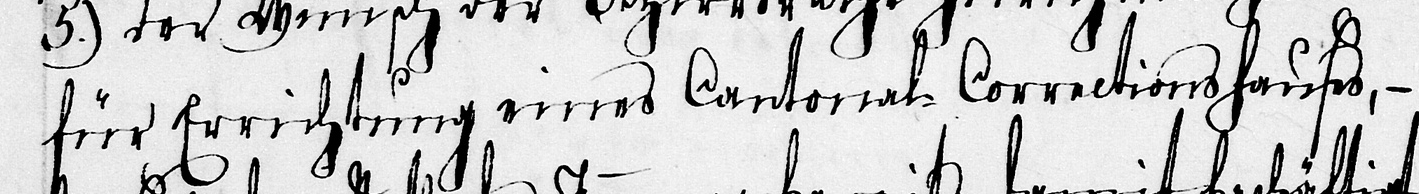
für Errichtung eines Cantonal-Correctionshauses, –
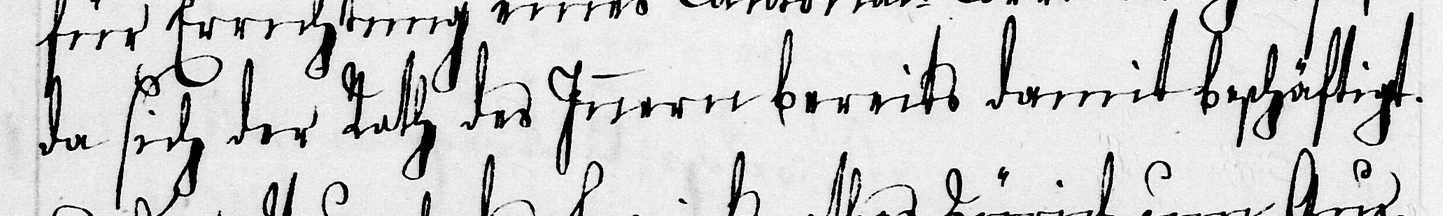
da sich der Rath des Innern bereits damit beschäftig¬
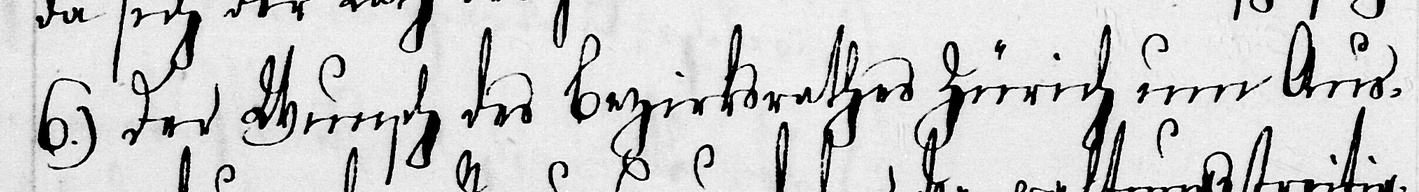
6.) Der Wunsch des Bezirksrathes Zürich um Aus¬
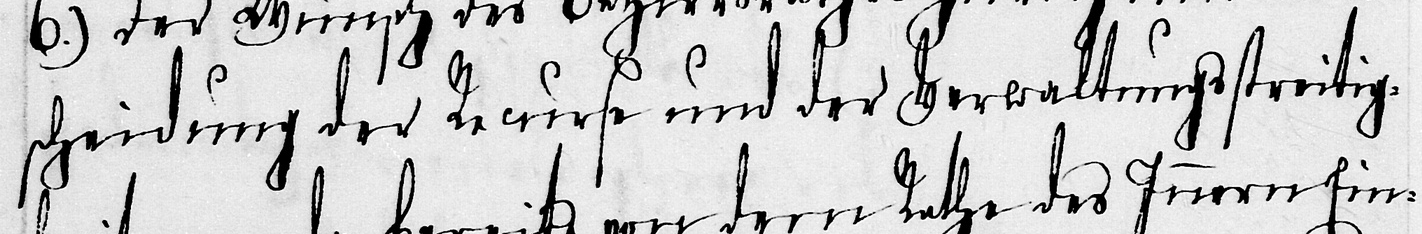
scheidung der Recurse und der Verwaltungsstreitig¬
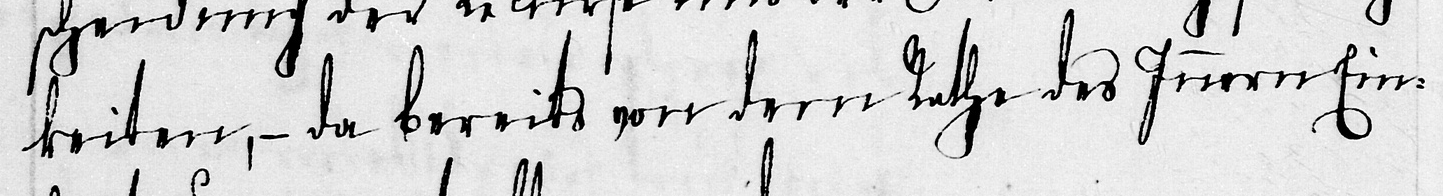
keiten, – da bereits von dem Rathe des Innern Ein¬
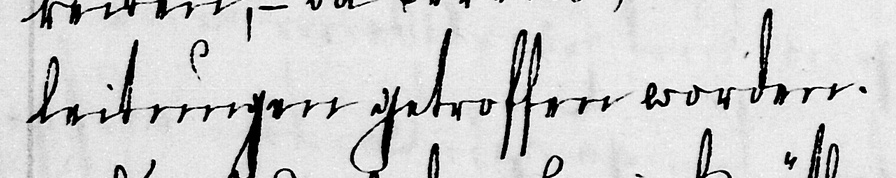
leitungen getroffen worden.
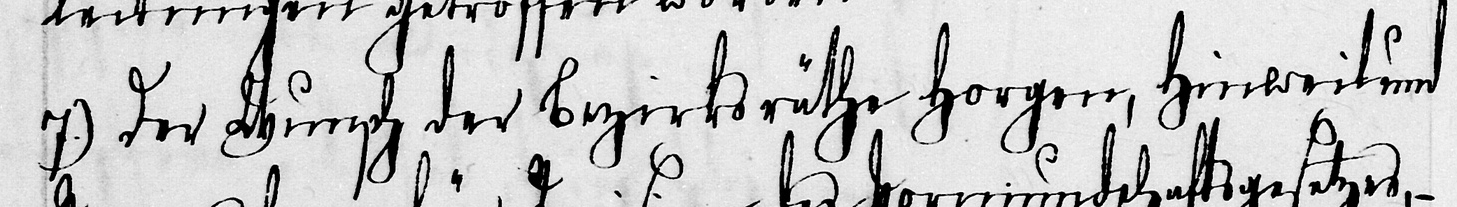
7.) Der Wunsch der Bezirksräthe Horgen, Hinweil und
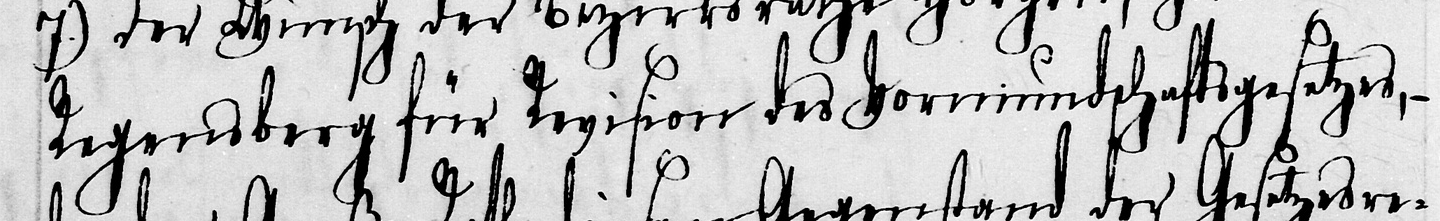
Regensberg für Revision des Vormundschaftsgesetzes,
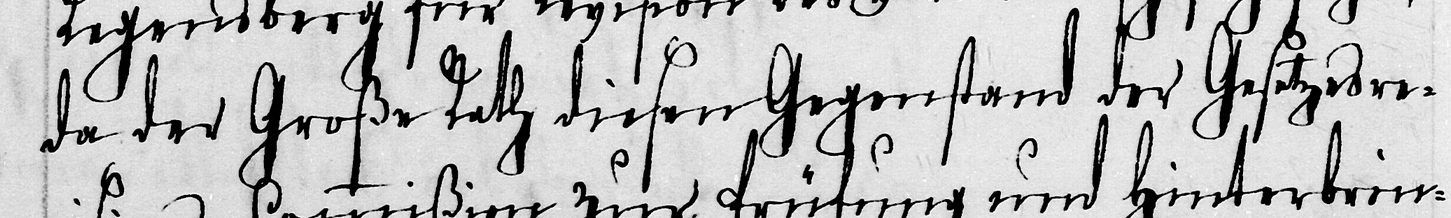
da der Große Rath diesen Gegenstand der Gesetzesr¬
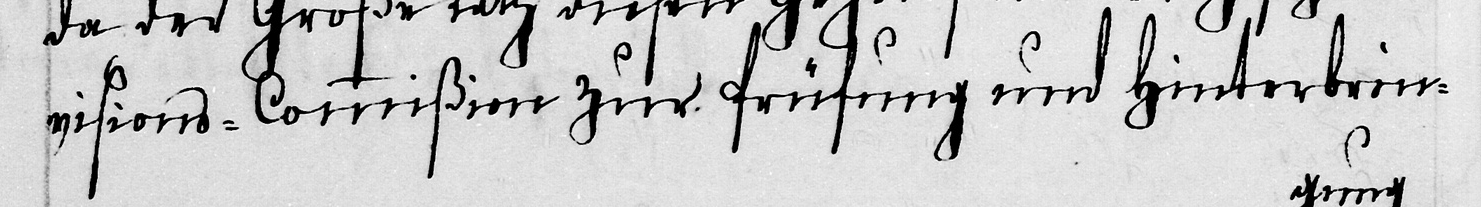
evisions-Commißion zur Prüfung und Hinterbrin-
